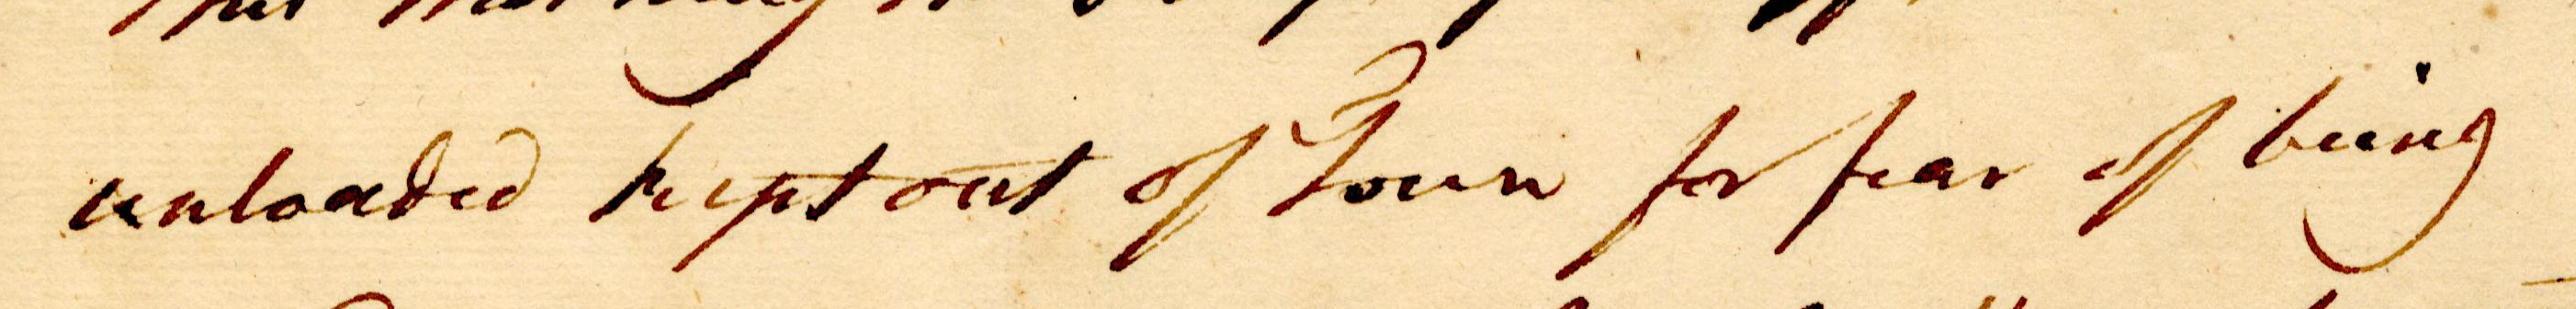unloaded kept out of Town for fear of being
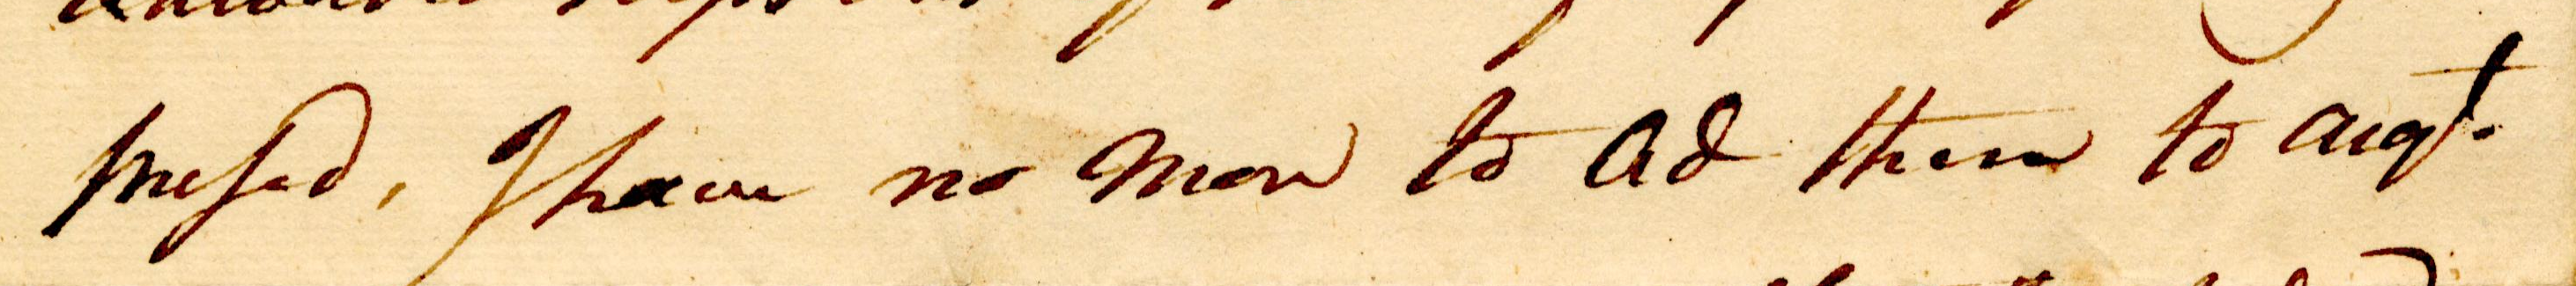pressed, I have no now to ad them to acq^t.
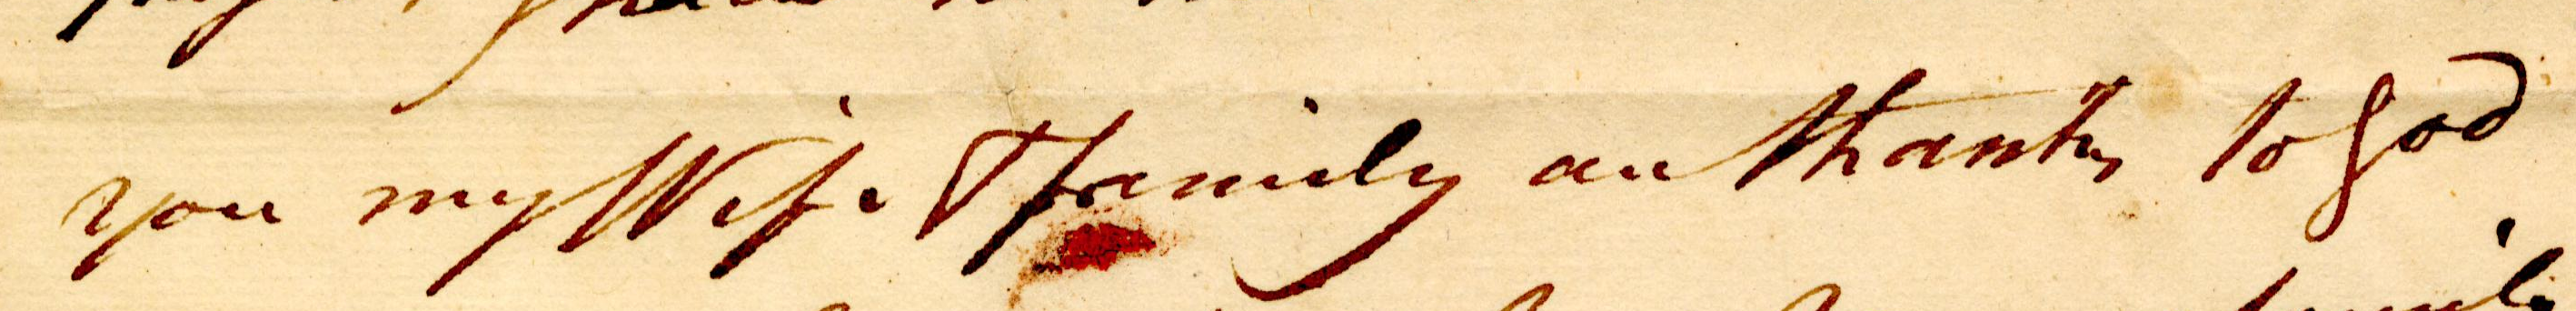you my Wife & family are thanks to God
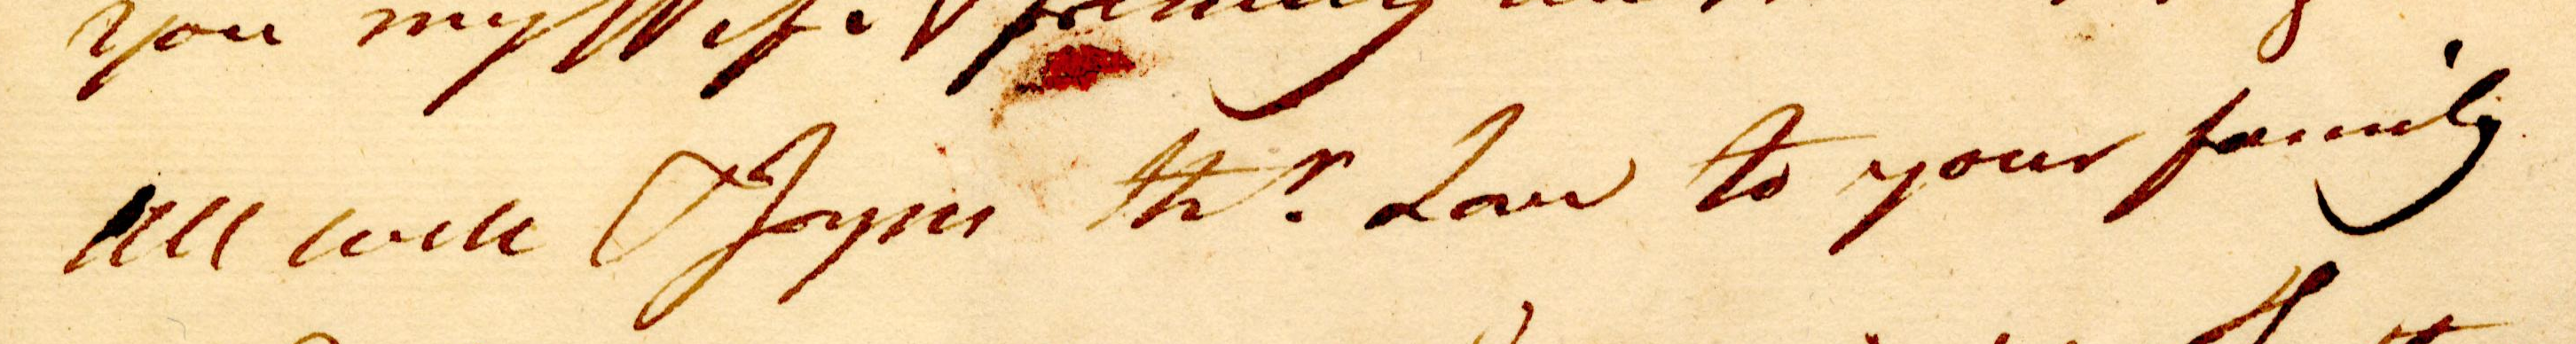all well & Joyns th^r. Love to your family
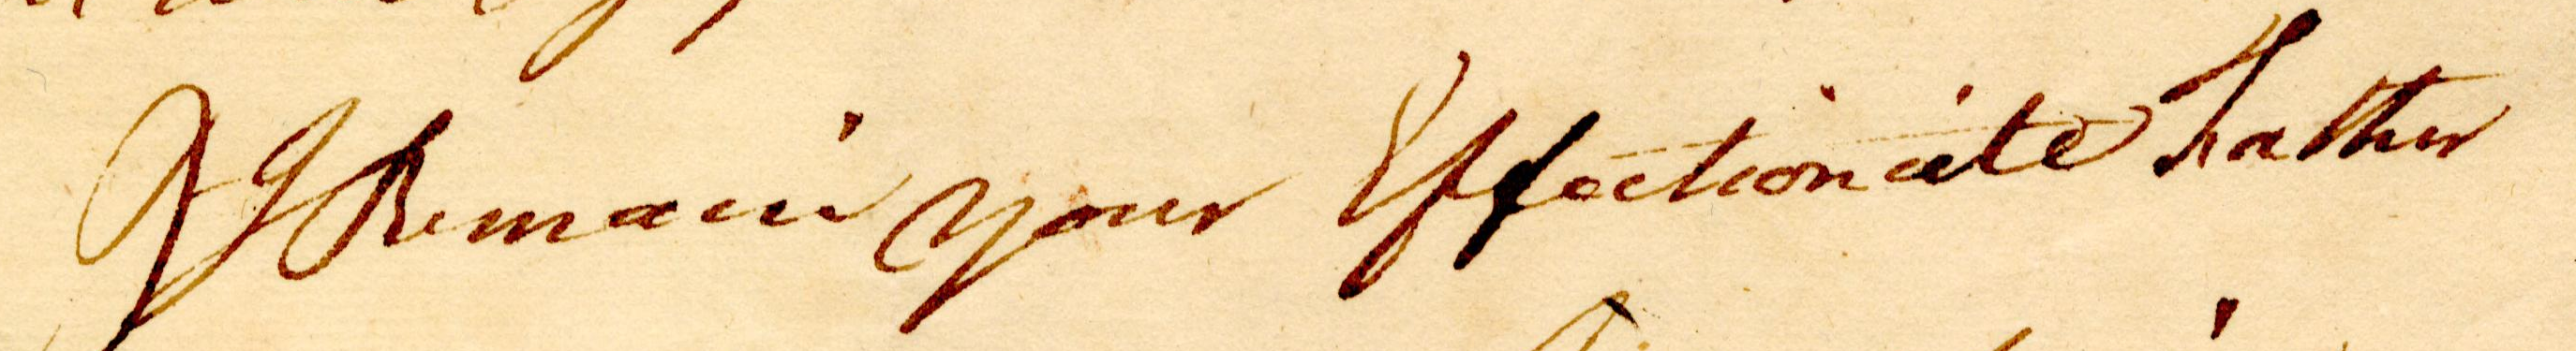& I Remain your Effectionate Father
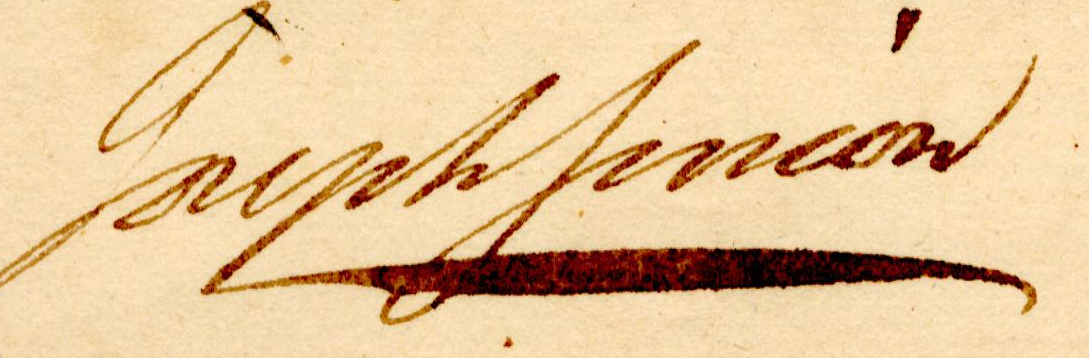Joseph Simon
